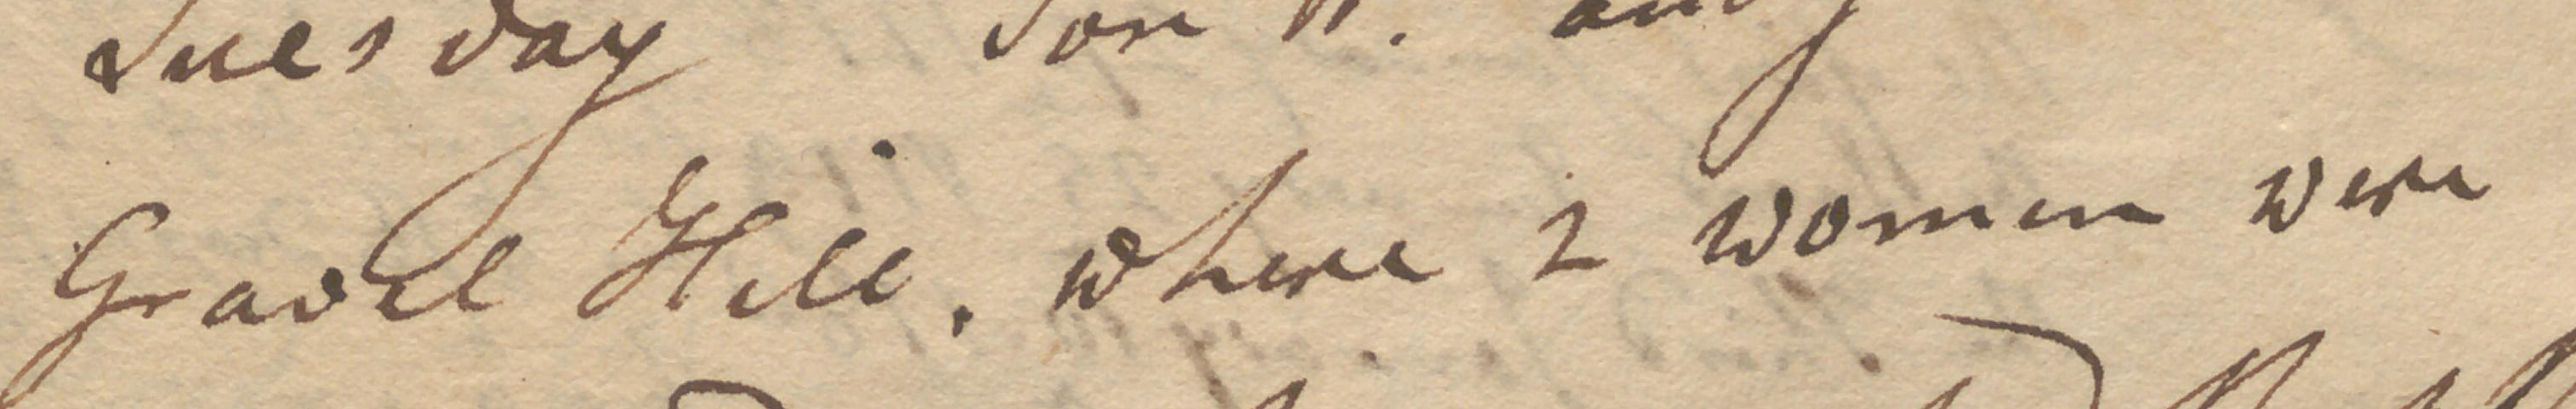Graoll Hill, where 2 women were
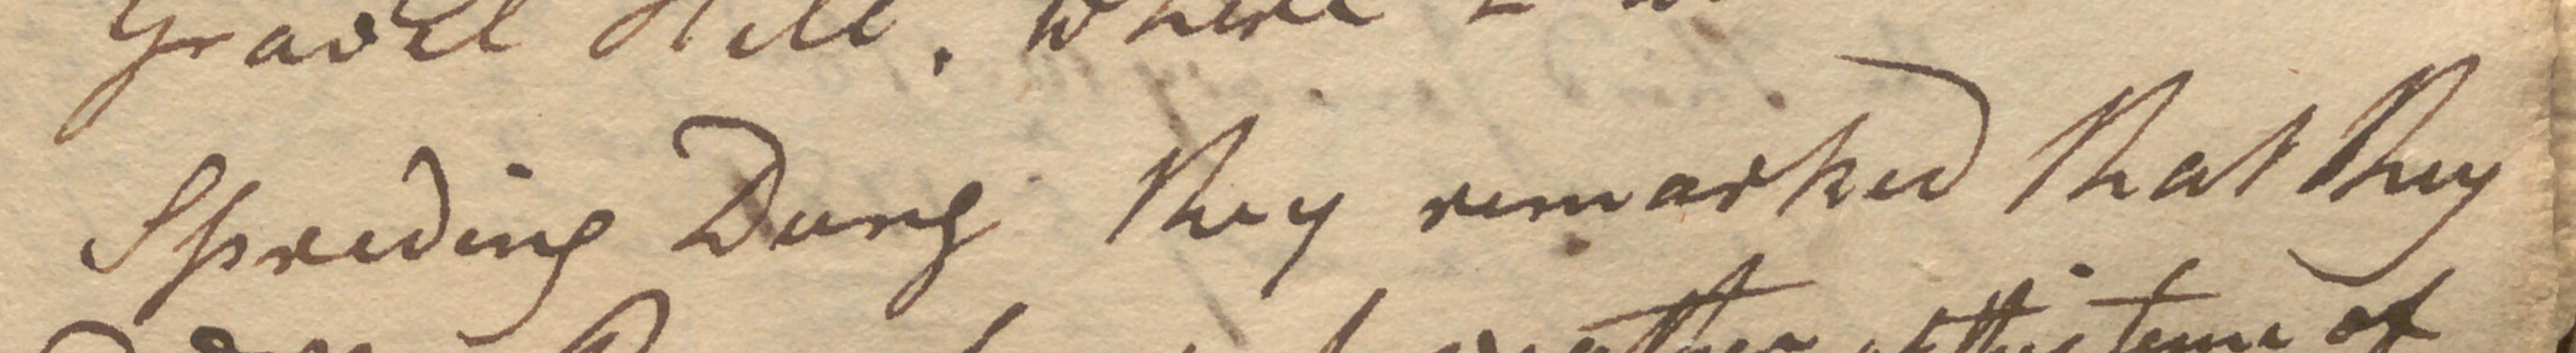Spreding Dung. they remarked that they
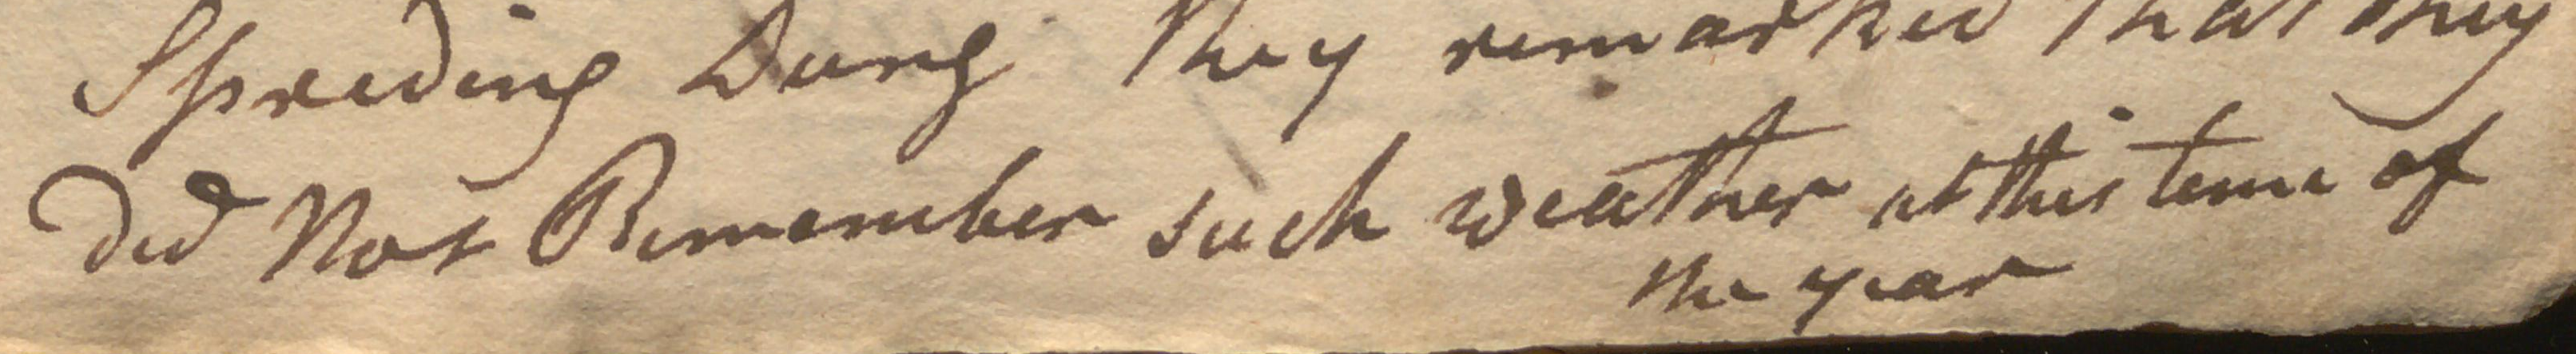did Not Remember such weather at this time of
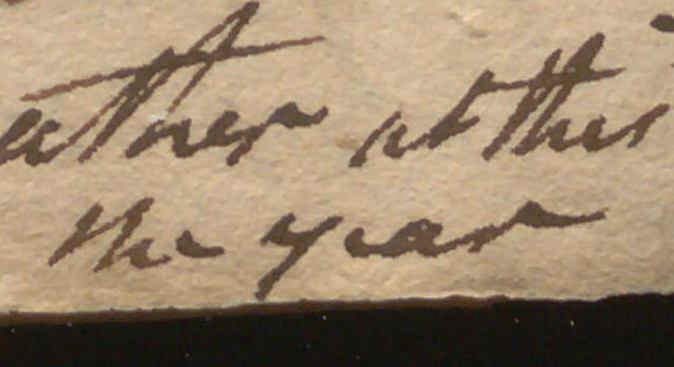the year
